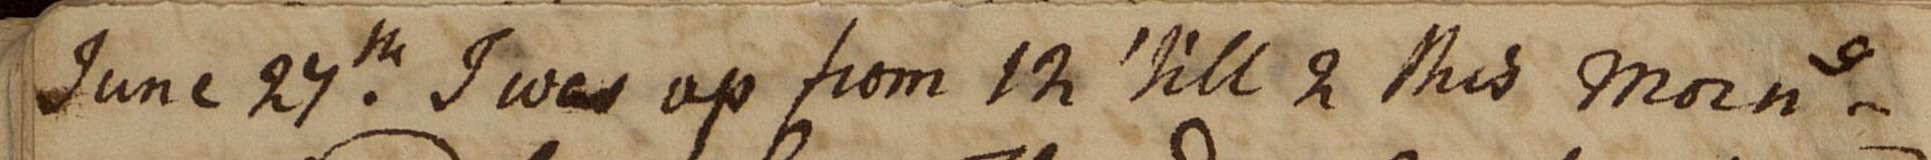June 24^th. I was up from 12 till 2 this morn^g-
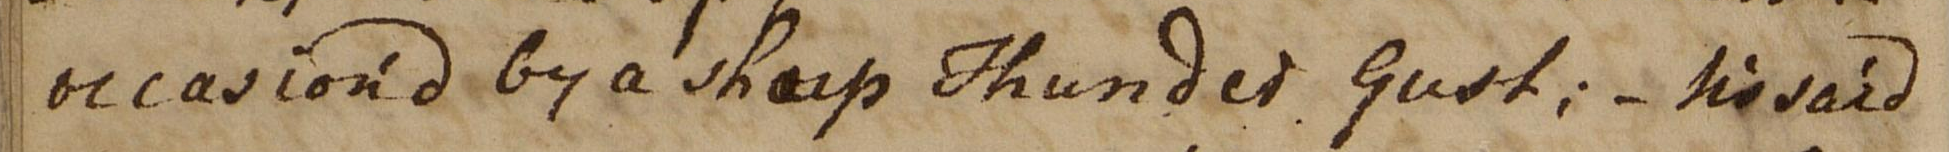occasion'd by a sharp Thunder Gust;- tis said
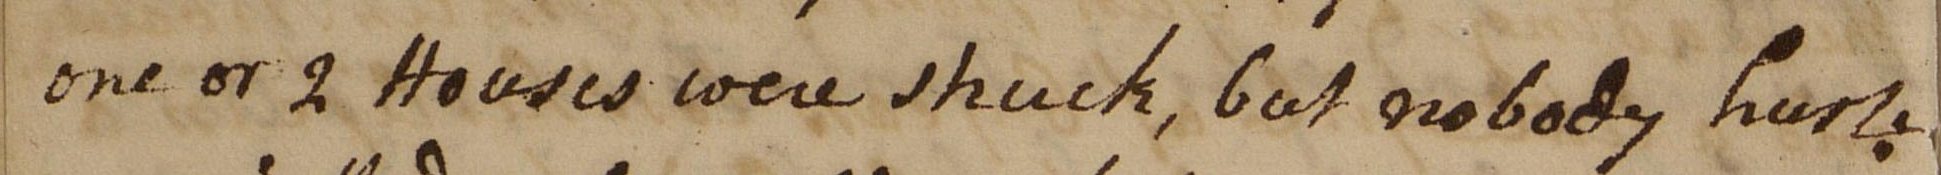one or 2 Houses were struck, but nobody hurt:
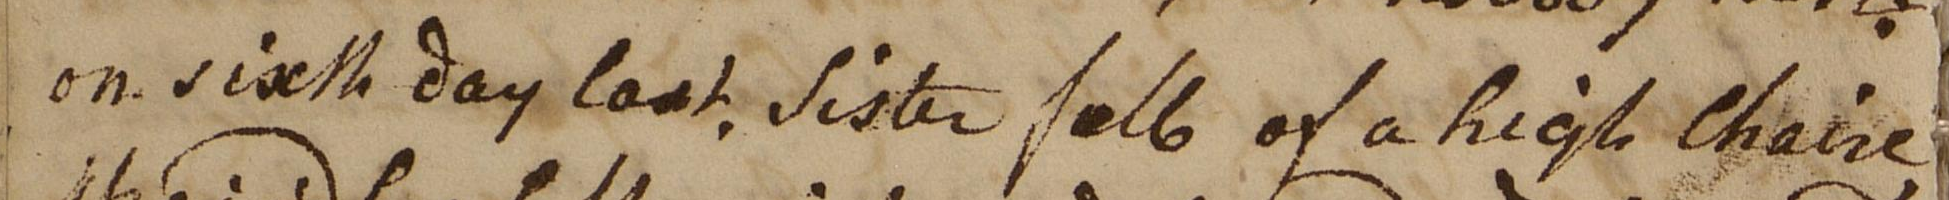on sixth day last, Sister fell of a high Chaire
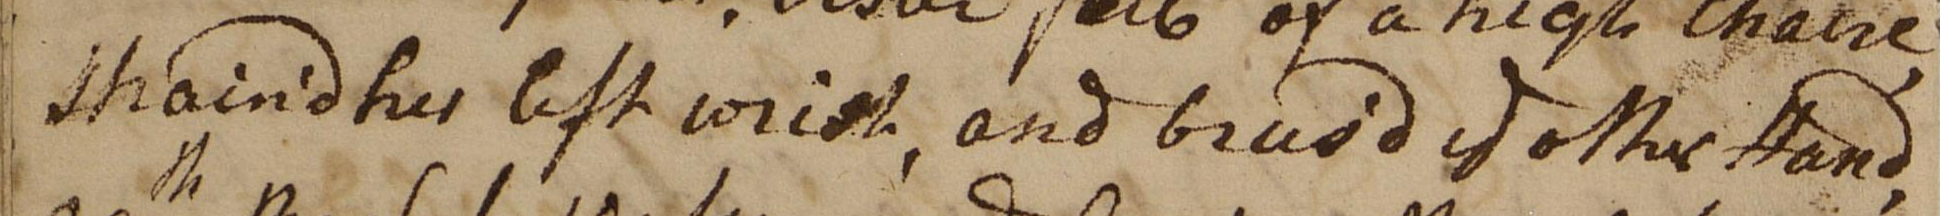strain'd her left wrist and brus'd y^e other Hand,
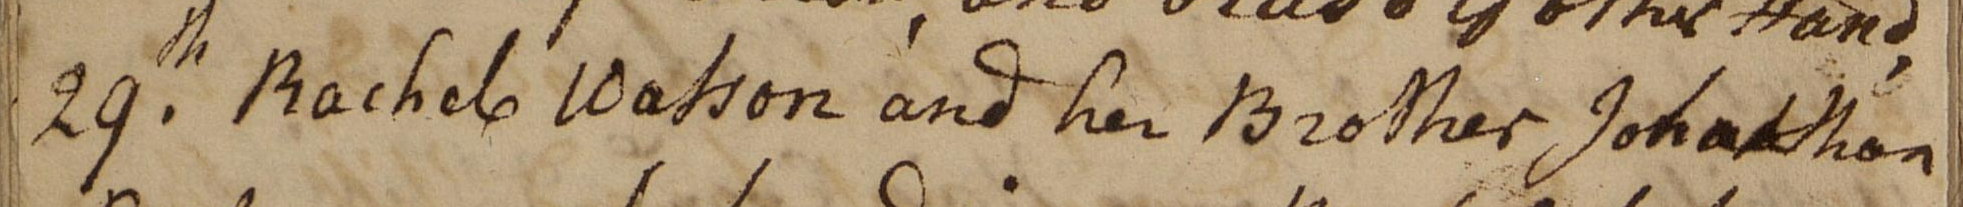29^th Rachel Watson and her Brother, Johathan
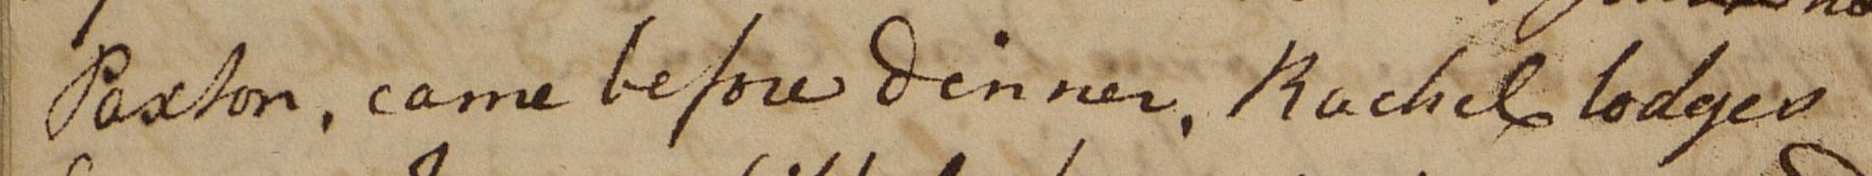Paxton, came before dinner, Rachel lodges
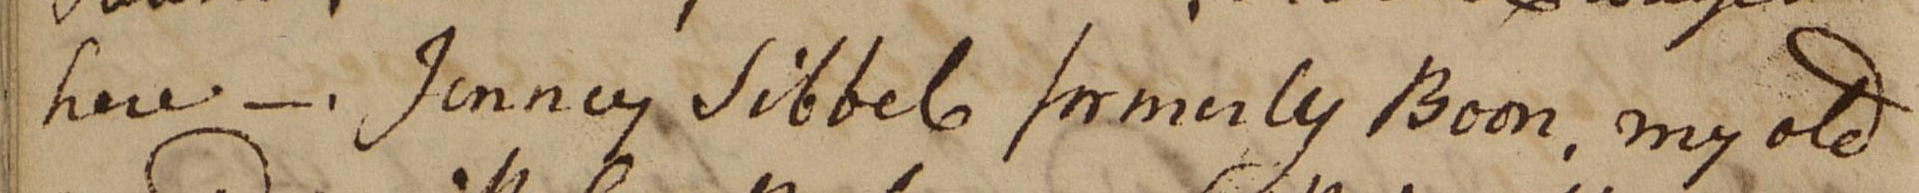here- Jenney Sibbel formerly Boon, my old
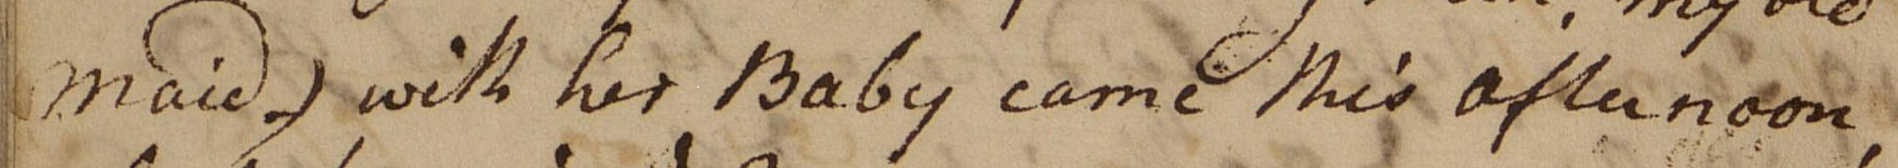maid, with her Baby came this afternoon,
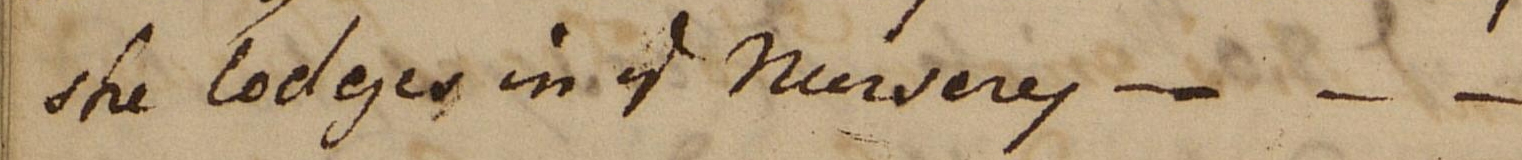she lodges in y^e Nursery---
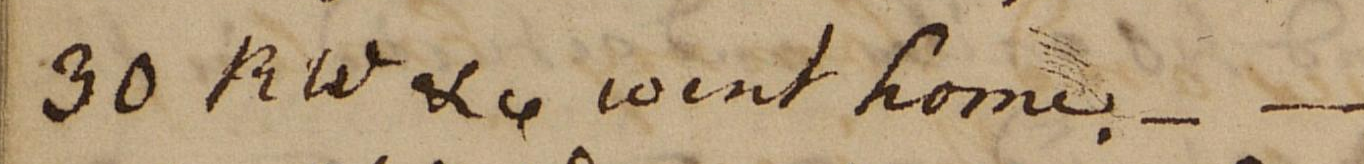30 RW &c went home,--
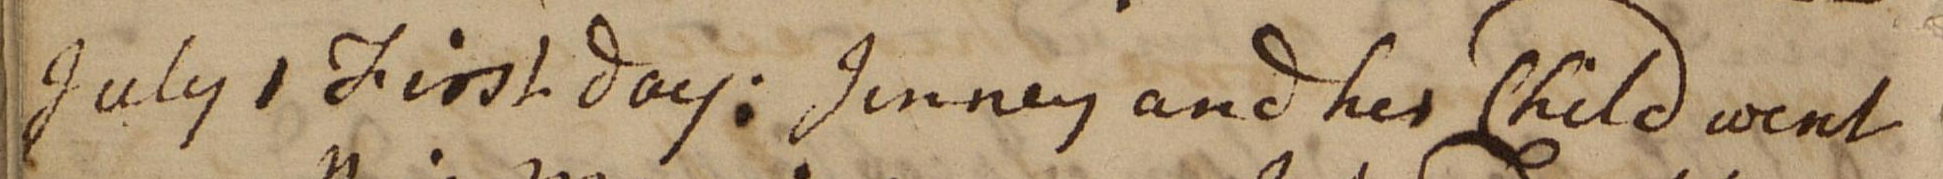July 1 First day: Jenney and her Child went
